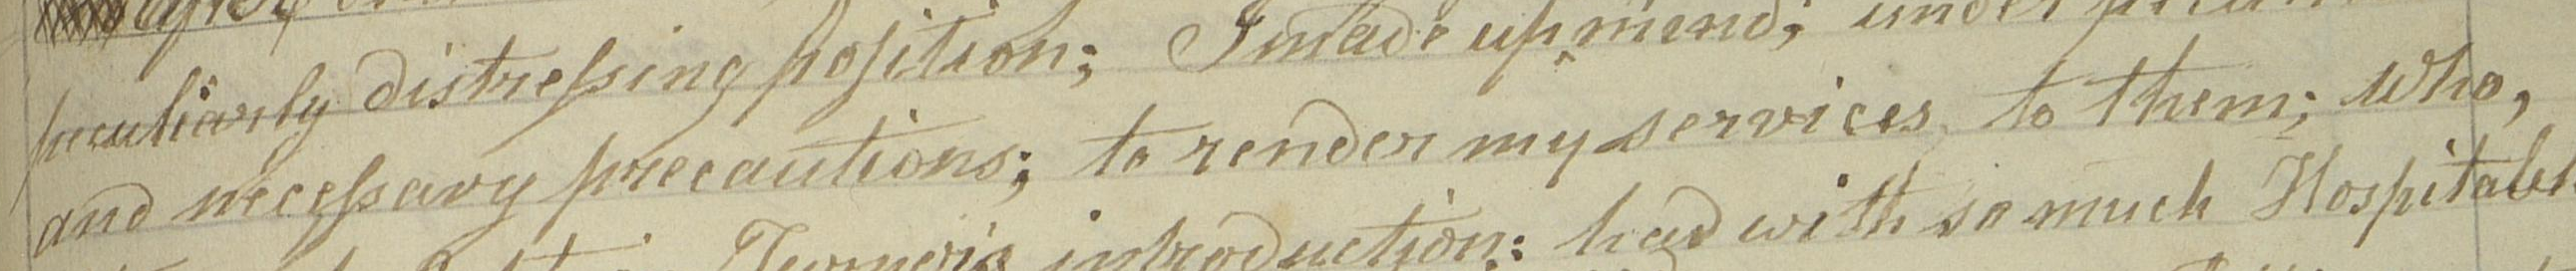and necessary precautions; to render my services to them; who,
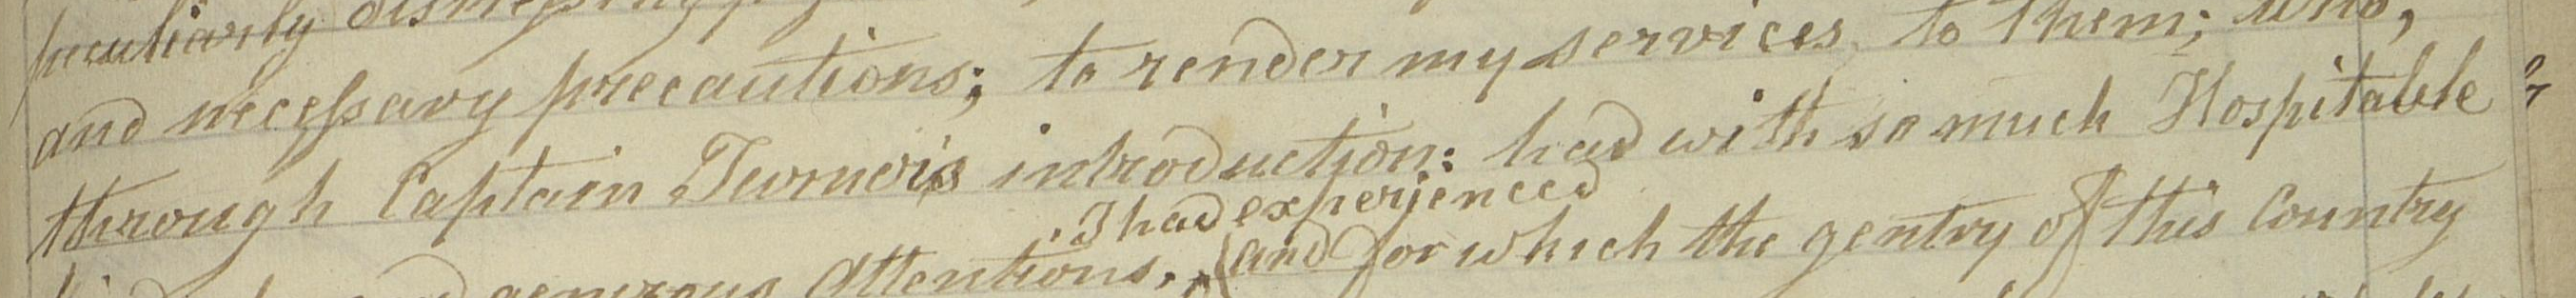through Captain Turner's introduction had with so much Hospitable
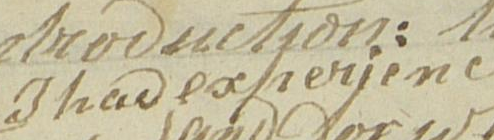I had experience
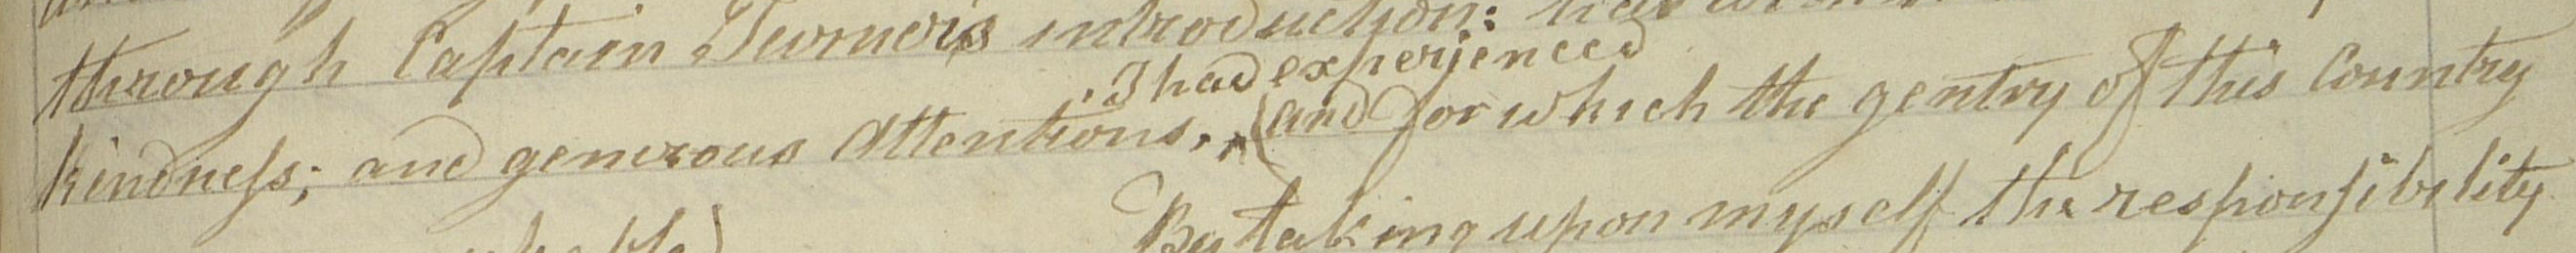Kindness; and generous attentions, ^ (and for which the gentry of this country
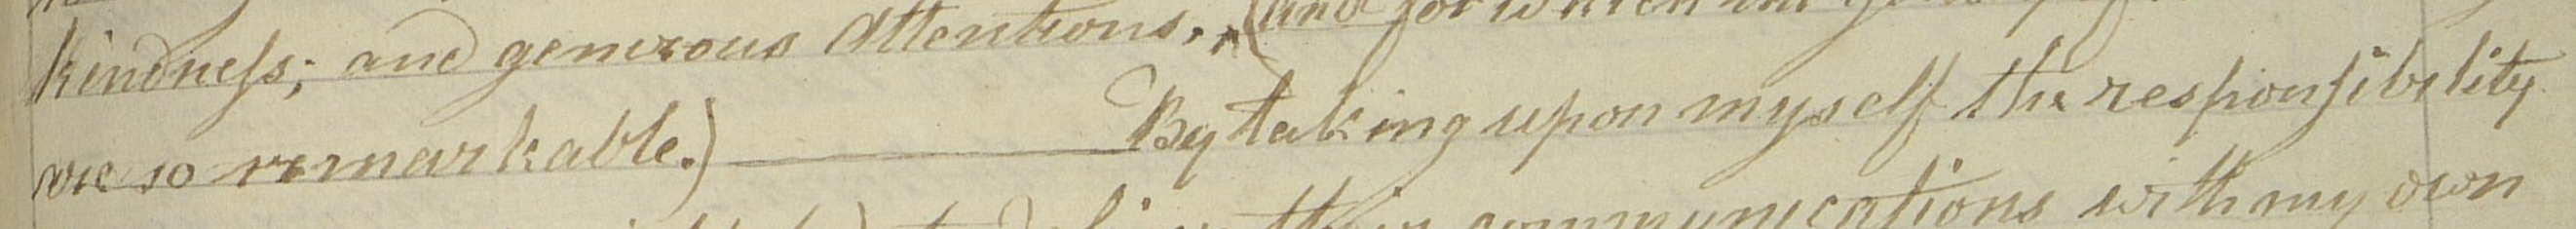me so remarkable.) By taking upon myself the responsibility
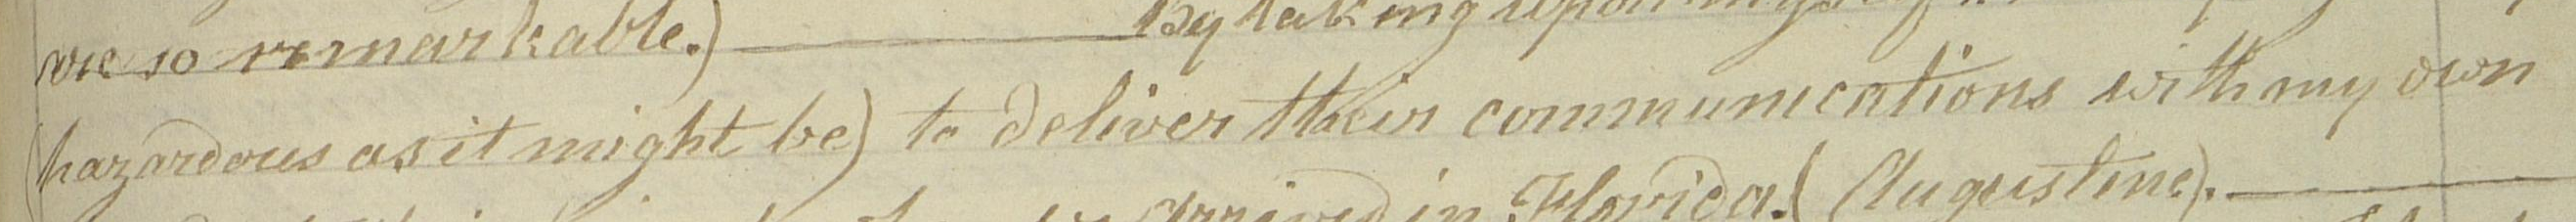hazardous as it might be) to deliver their communications with my own
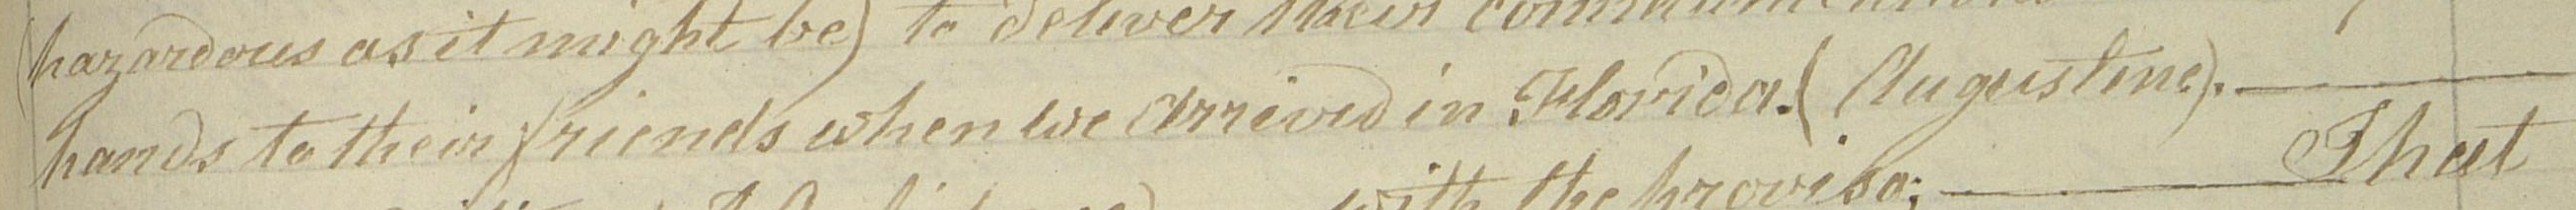hands to their friends when we arrived in Florida. (Augustine).
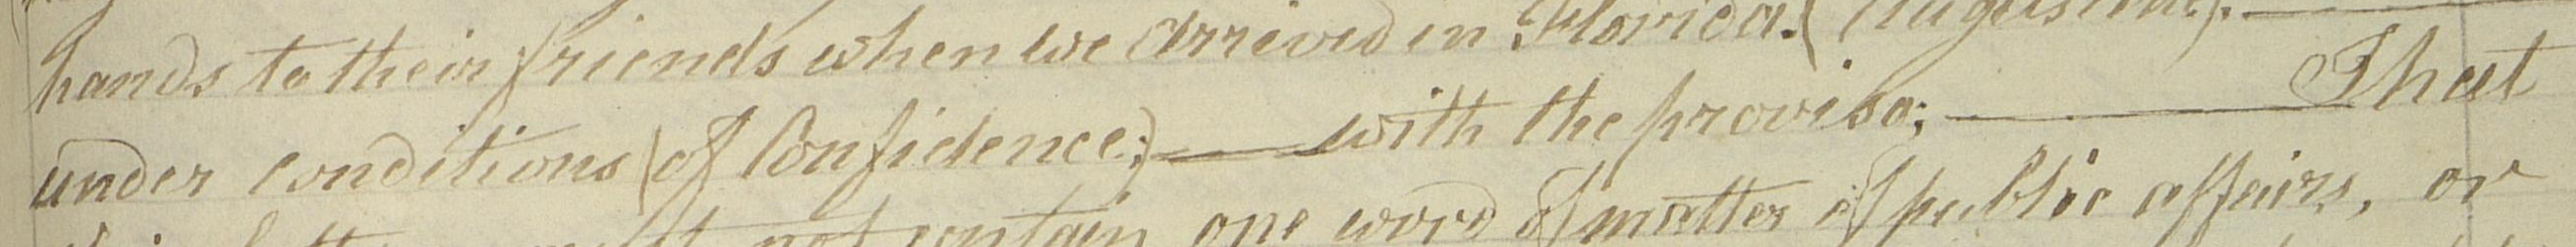under conditions (of Confidence); with the proviso; that
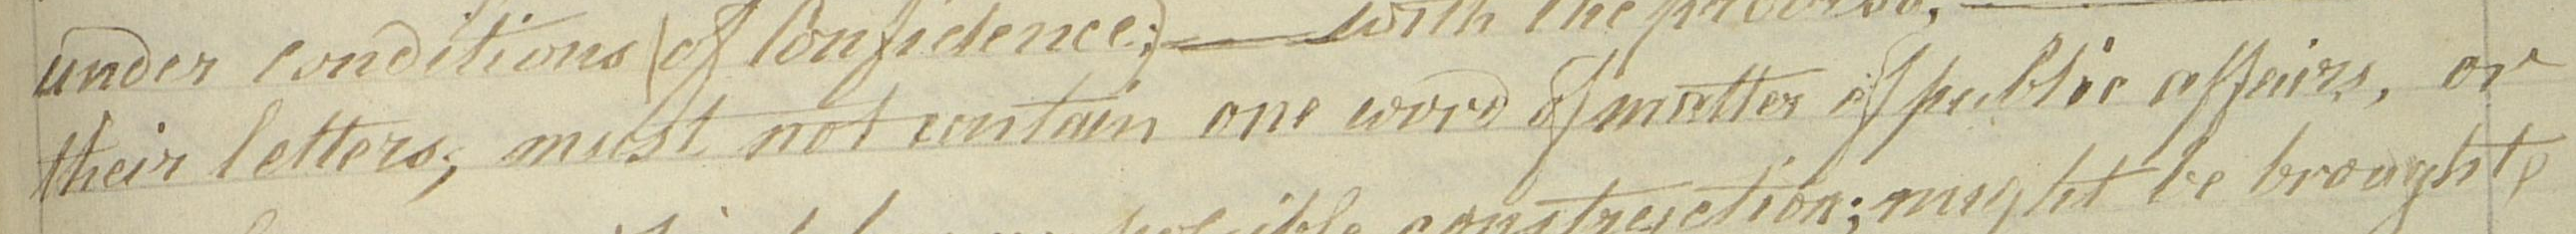their letters, must not contain one word of matter of public affairs, or
